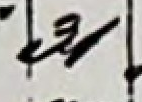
31
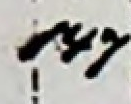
147
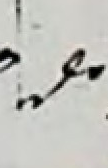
do
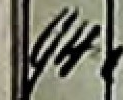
94
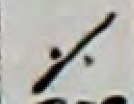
./.
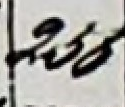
256
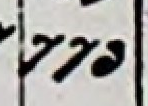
773
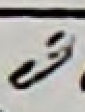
3
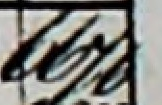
667,6
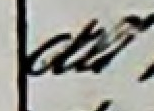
Alt
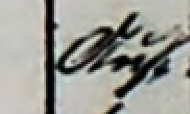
Aus„
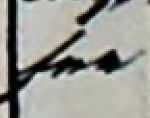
see
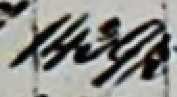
1439/i
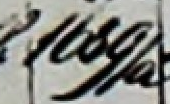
1689/a
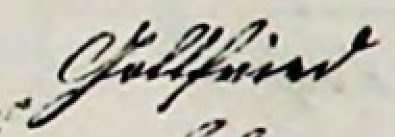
Gottfried
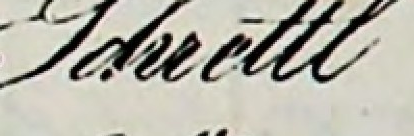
Schrettl
